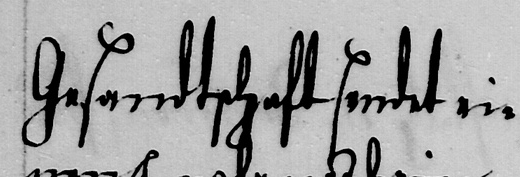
Begutachtung ü¬
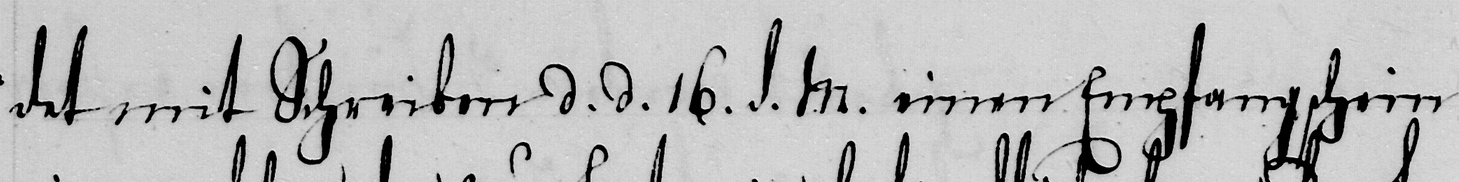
det mit Schreiben d. d. 16. d. M. einen Empfangsschein
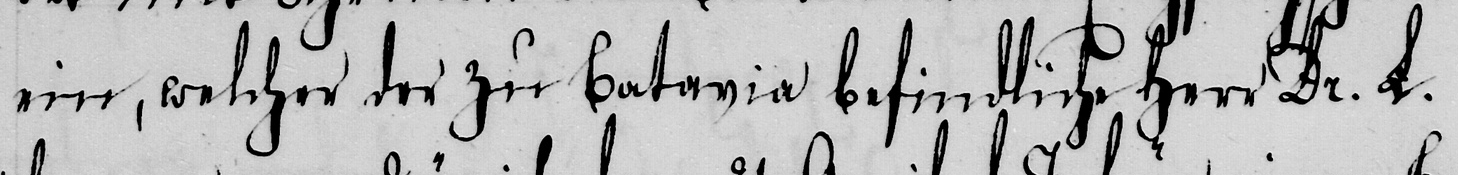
ein, welcher der zu Batavia befindliche Herr Dr. L.
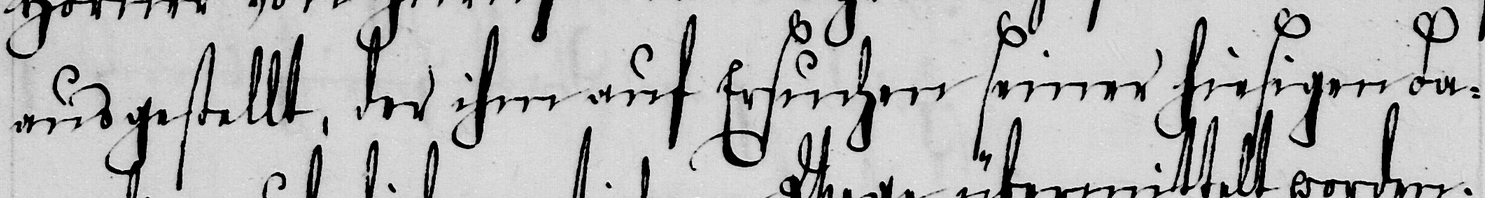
ausgestellt, der ihm auf Ersuchen seiner hiesigen Fa¬
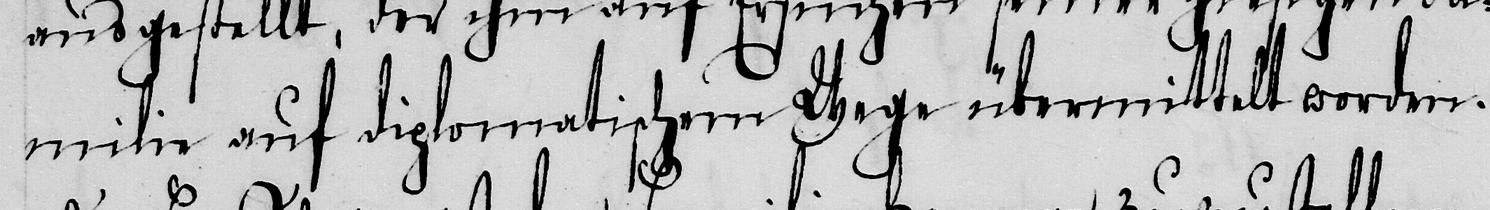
milie auf diplomatischem Wege übermittelt worden.
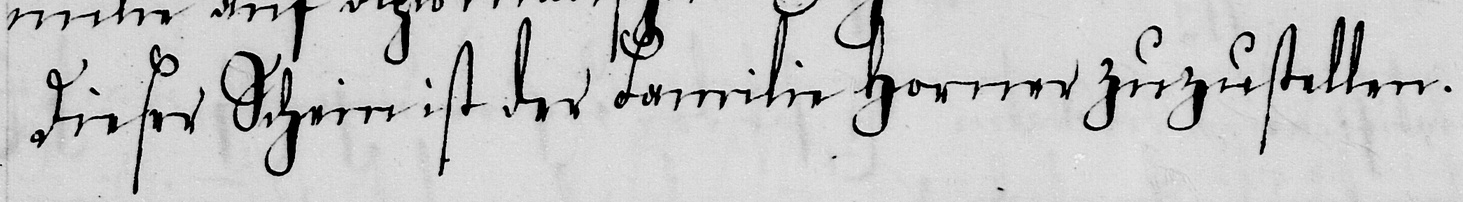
Dieser Schein ist der Familie Horner zuzustellen.
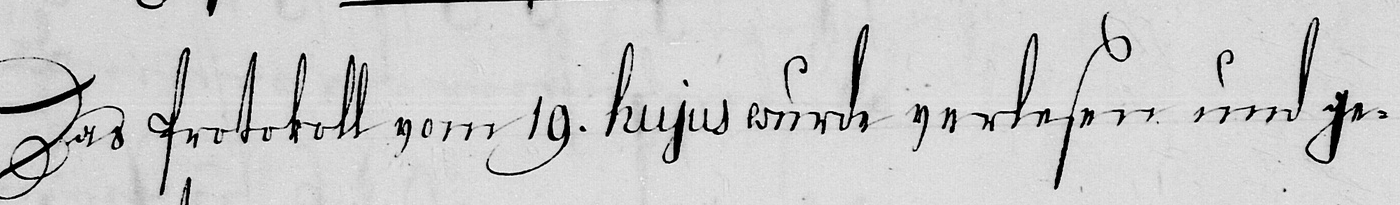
Das Protokoll vom 19. hujus wurde verlesen und ge¬
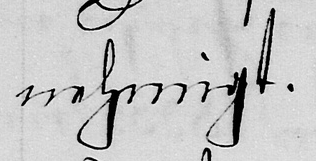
nehmigt.
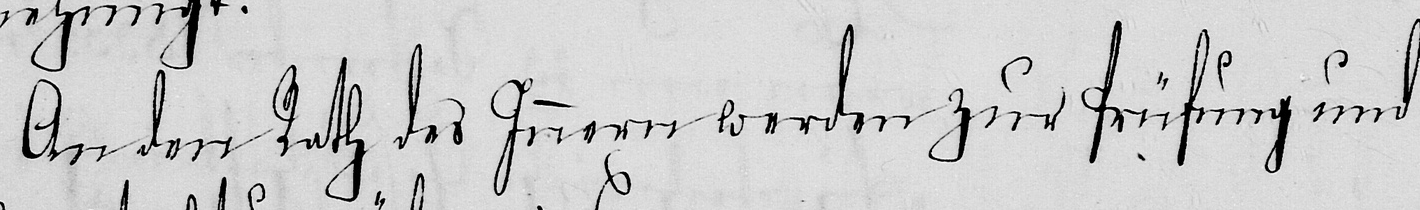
An den Rath des Innern werden zur Prüfung und
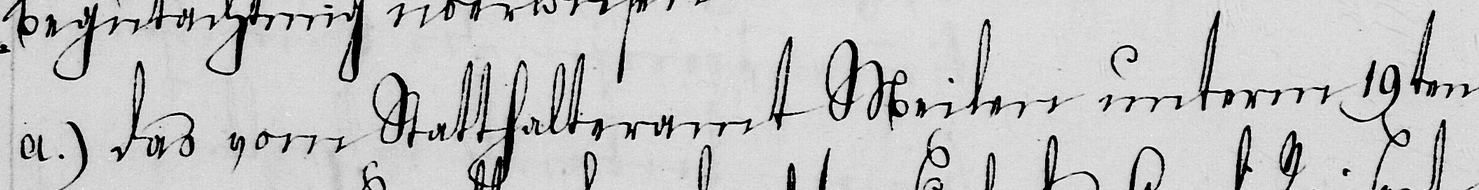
a.) das vom Statthalteramt Meilen unterm 19ten
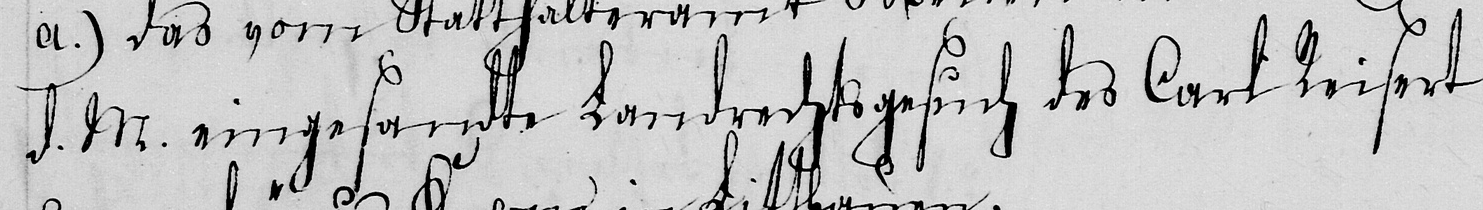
d. M. eingesandte Landrechtsgesuch des Carl Reisert
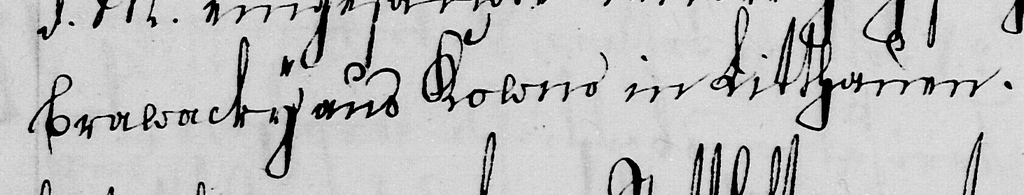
Brawacky aus Kowno in Litthauen.
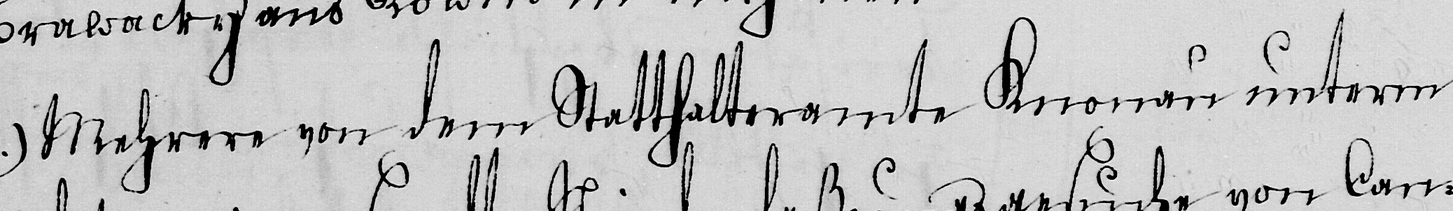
Mehrere von dem Statthalteramte Knonau unterm
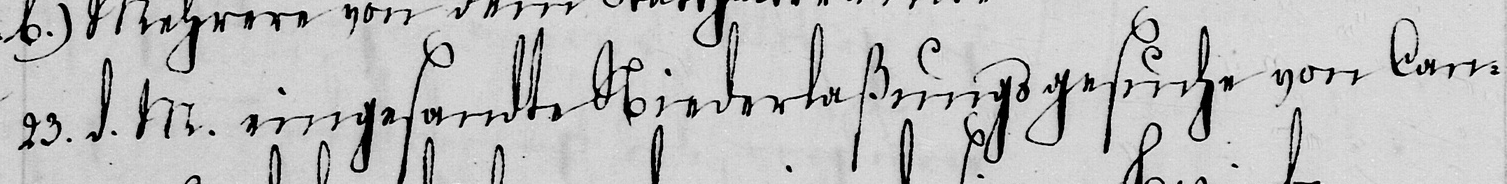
23. d. M. eingesandte Niederlaßungsgesuche von Can¬
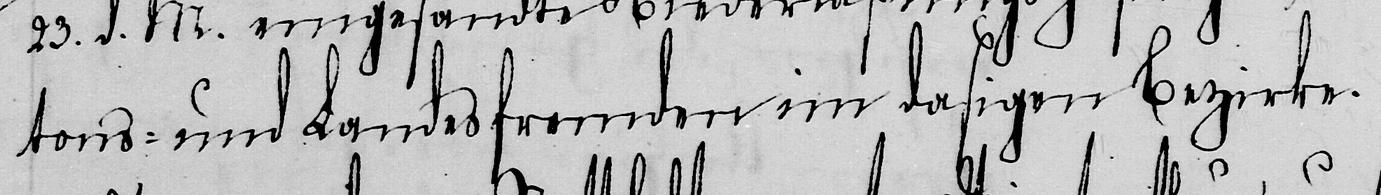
tons- und Landesfremden im dasigen Bezirke.
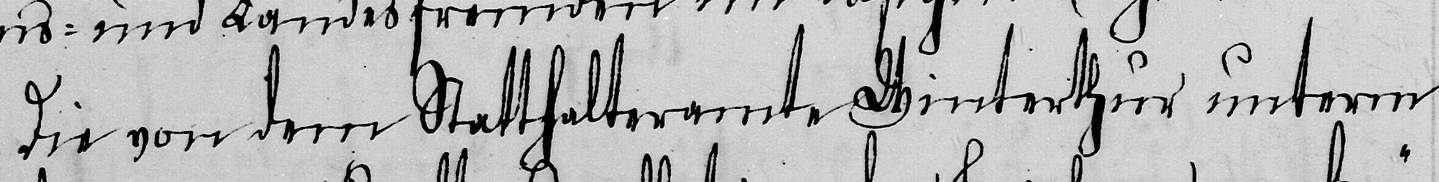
Die von dem Statthalteramte Winterthur unterm
